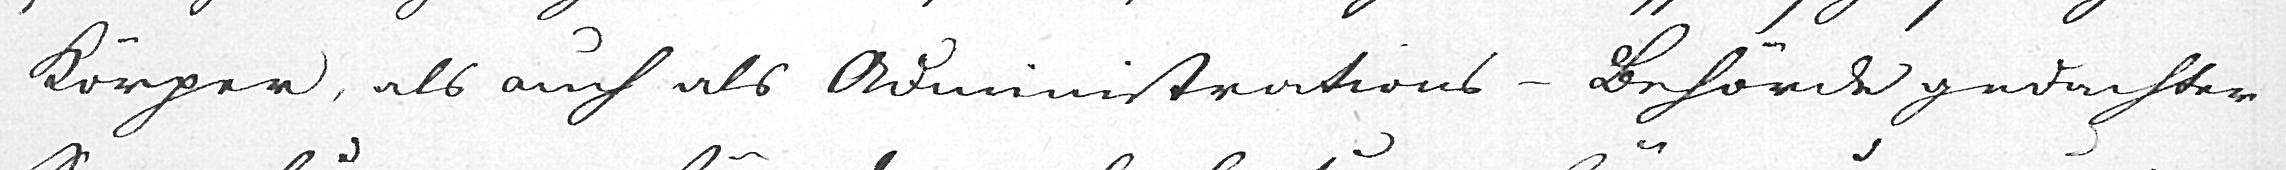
Körper, als auch als Administratons-Behörde gedachter
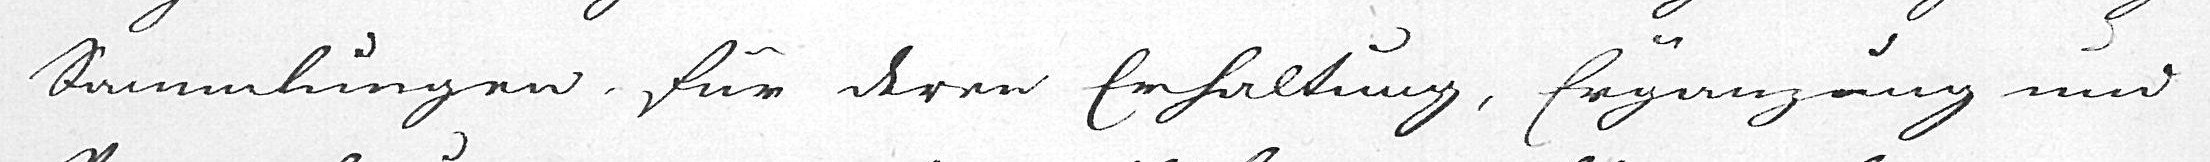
Sammlungen, für deren Erhaltung, Ergänzung und
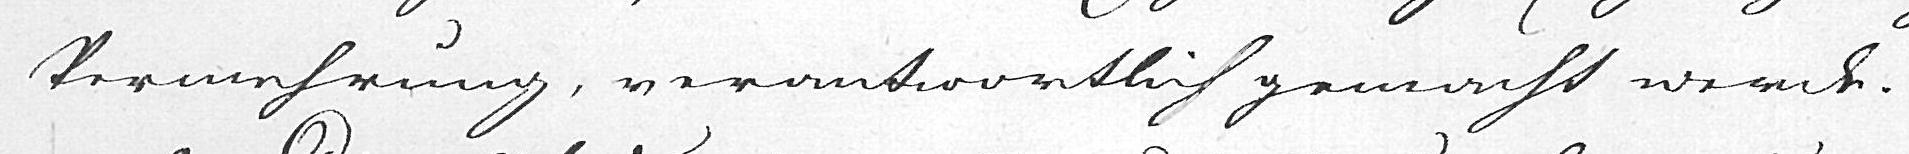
Vermehrung, verantwortlich gemacht werde.
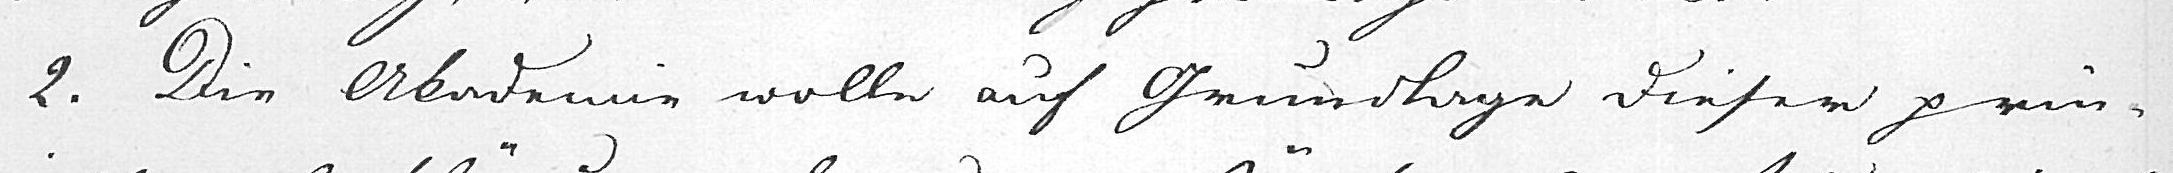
2. Die Akademie wolle auf Grundlage dieser prin-
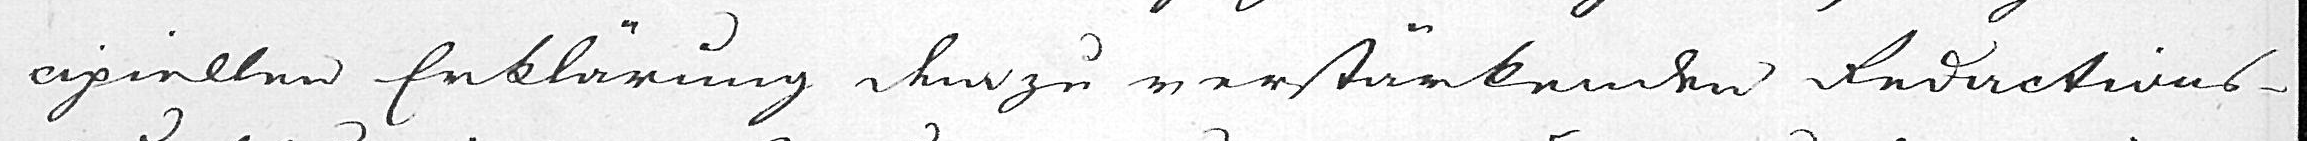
cipiellen Erklärung dem zu verstärkenden Redactions-
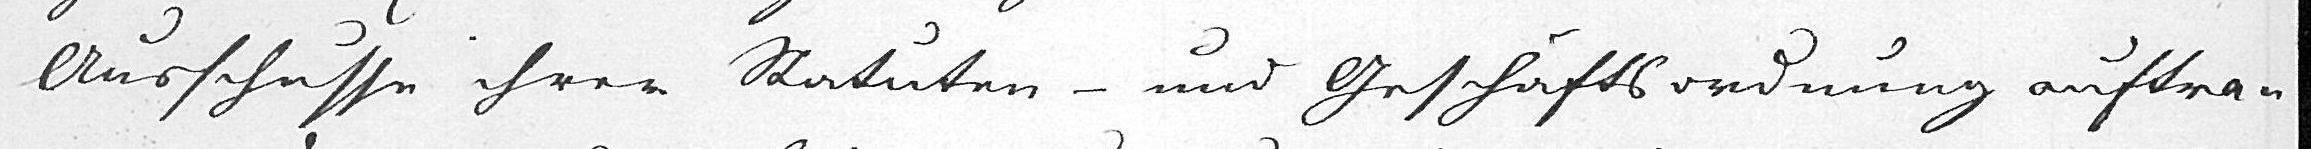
Ausschusse ihrer Statuten- und Geschäftsordnung auftra-
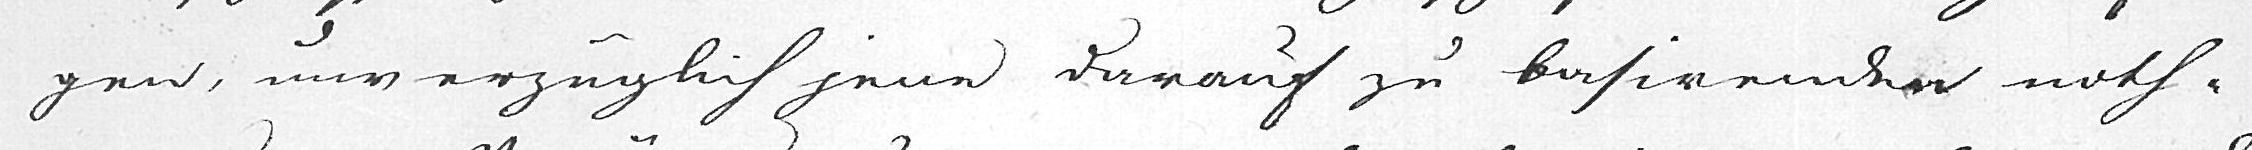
gen, unverzüglich jene darauf zu basirenden noth-
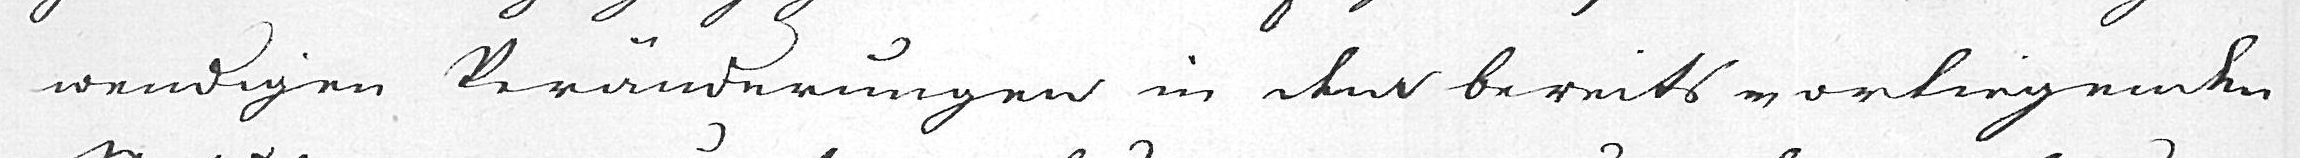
wendigen Veränderungen in dem bereits vorliegenden
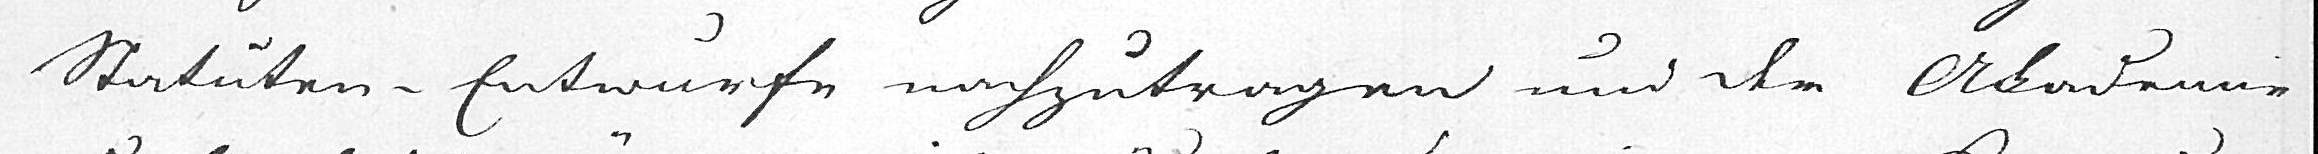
Statuten-Entwurfe nachzutragen und der Akademie
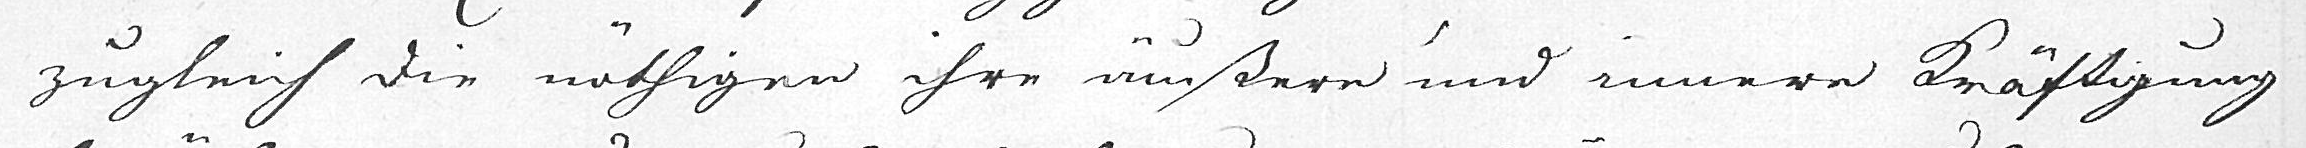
zugleich die nöthigen ihre äußern und innern Kräftigung
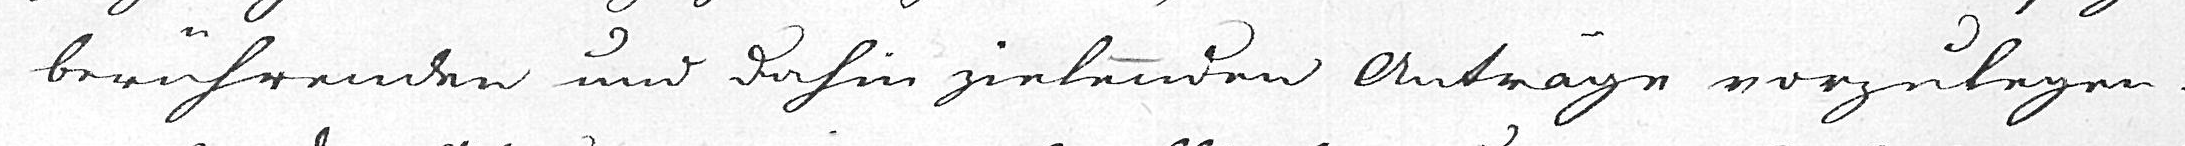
berührenden und dahin zielenden Anträge vorzulegen.
